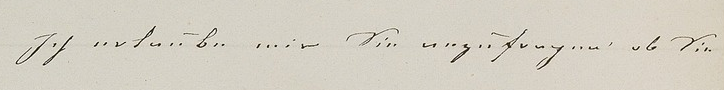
Ich erlaube mir Sie anzufragen, ob Sie
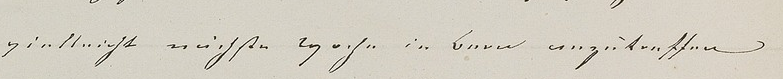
viellleicht nächste Woche in Bern anzutreffen
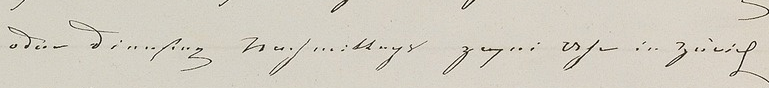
oder Dienstag Nachmittags zwei Uhr in Zürich
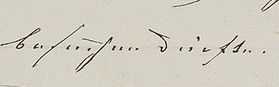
besuchen dürfte.
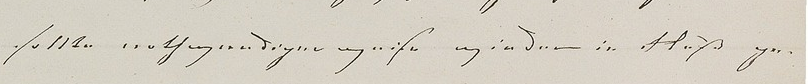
sollte nothwendigerweise wieder in Fluß ge-
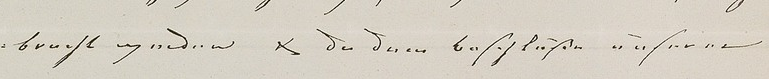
gebracht werden & da dem Beschluße unserer
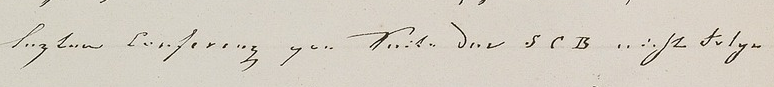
lezten Conferenz von Seite der SCB nicht Folge
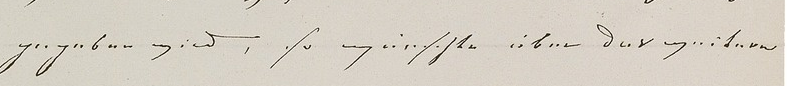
gegeben wird, so wünschte über das weitere
